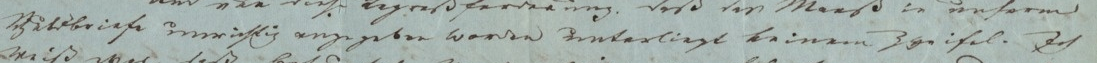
Schuldbriefe unrichtig angegeben worden unterliegt keinem Zweifel. Ich
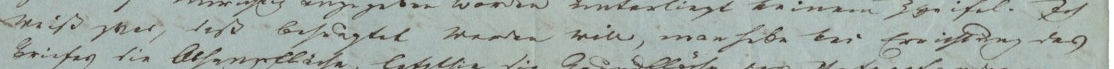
weiß zwar, daß behauptet werden will, man habe bei Errichtung des
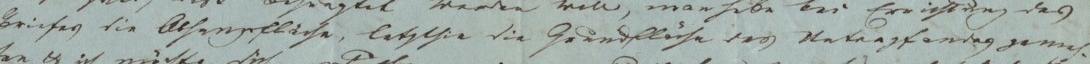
Briefes die Abhangsfläche, letzthin die Grundfläche des Unterpfandes gemes-
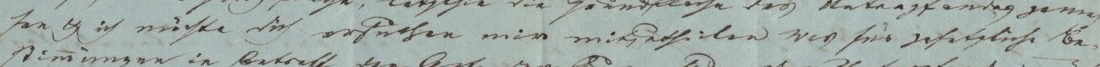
sen & ich möchte Dich ersuchen mir mitzutheilen was für gesetzliche Be-
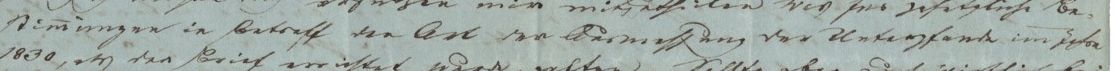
stimmungen in Betreff der Art der Ausmessung der Unterpfande im Jahre
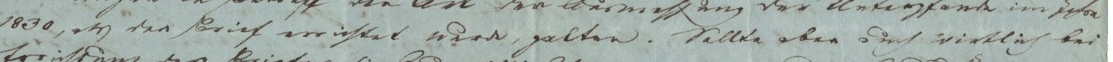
1830, als der Brief errichtet wurde, galten. Sollte aber auch wirklich bei
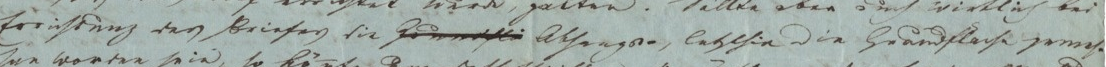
Errichtung des Briefes die Grundflä Abhangs-, letzthin die Grundfläche gemes-
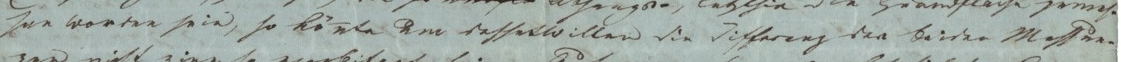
sen worden sein, so könnte um dessetwillen die Differenz der beiden Messun-
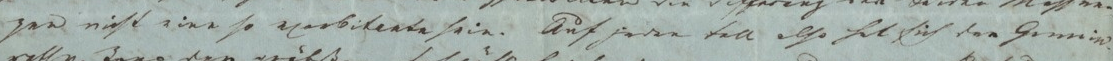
gen nicht eine so exorbitante sein. Auf jeden Fall also hat sich der Gemeind-
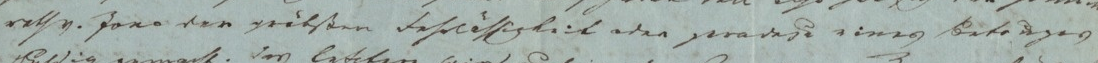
rath v. Jona der gröbsten Fahrlässigkeit oder geradezu eines Betruges
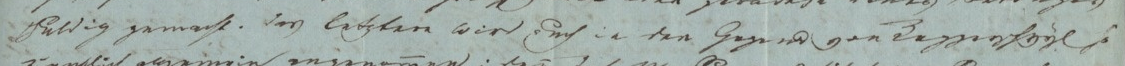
schuldig gemacht. Das letztere wird auch in der Gegend von Rapperschwyl
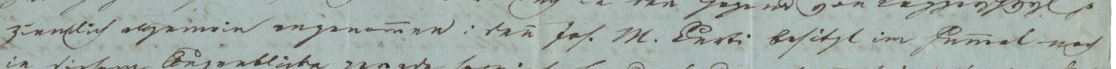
ziemlich allgemein angenommen: denn Jos. M. Curti besitzt im Hummel noch
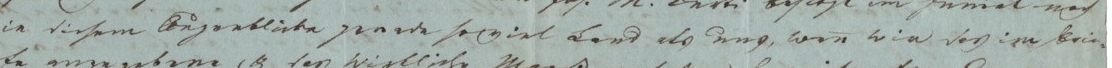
in diesem Augenblicke gerade so viel Land als uns, wenn wir das im Brie-
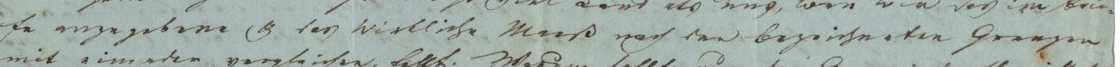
fe angegebene & das wirkliche Maaß nach den bezeichneten Grenzen
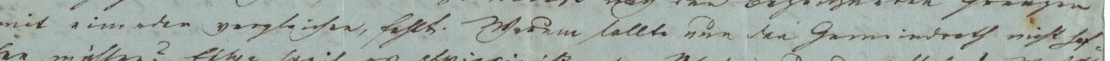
mit einander vergleichen, fehlt. Warum sollte nun der Gemeindrath nicht haf-
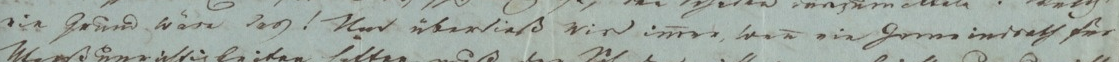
ein Grund wäre das! Und überdieß wird immer, wenn ein Gemeindrath für
